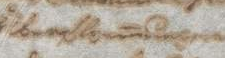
Überschwemmungen des
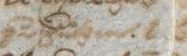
Tessin zu schützen.
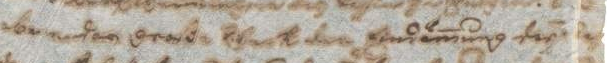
aber das große Werk der Eindämmung des Tessin
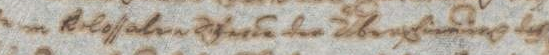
dem kolossalen Werke der Überschienung des
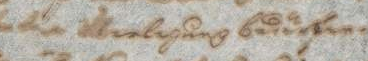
schon der Überlegung bedürfen.
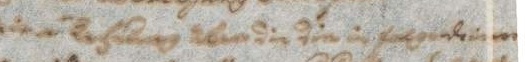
Deine Rechnung über die Dir in Folge Deiner
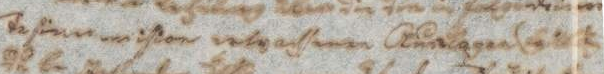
Tessinermission erwachsenen Auslagen willst
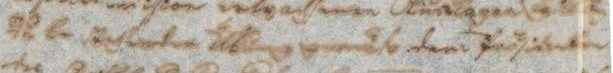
Du bestehender Übung gemäß dem Präsidenten
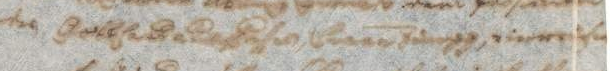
des Gotthardausschusses, Herrn Zingg, einreichen.
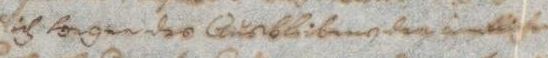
Dich wegen des Ausbleibens der amtlichen
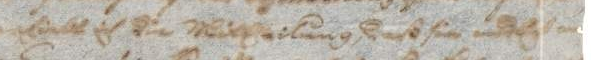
erhielt ich die Mittheilung, daß sie endlich an-
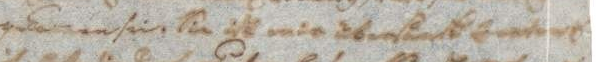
gekommen sei. Sie ist mir übersandt worden &
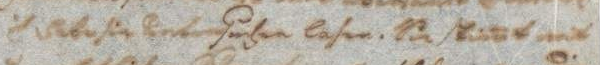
ich habe sie untersuchen lassen. Sie stimmt mit
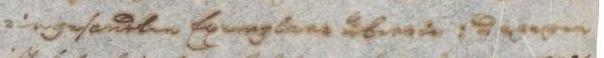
eingesandten Exemplare überein: Dagegen
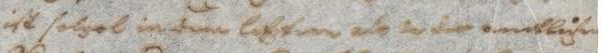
ist sowol in dem letztern als in der amtlichen
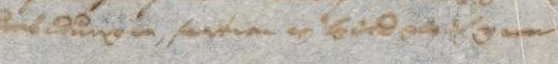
ausbedungen, sondern es wird gleich vom
